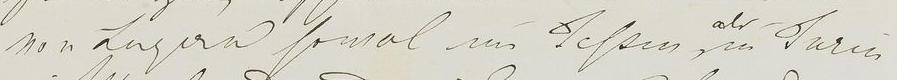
von Luzern sowol im Tessin, als in Turin,
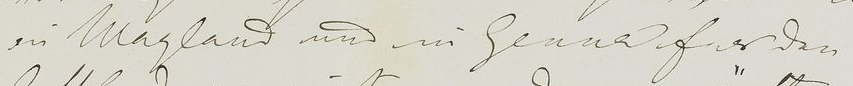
in Mayland und in Genua für den
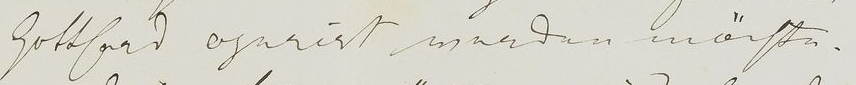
Gotthard operirt werden möchte.
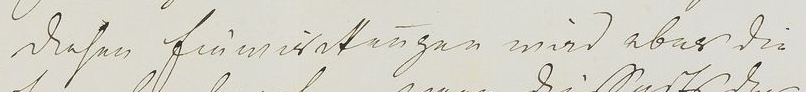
Diesen Einwirkungen wird aber die
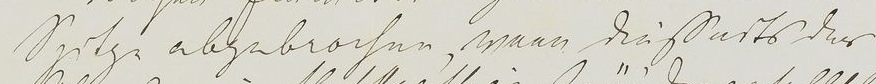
Spitze abgebrochen, wenn diesseits der
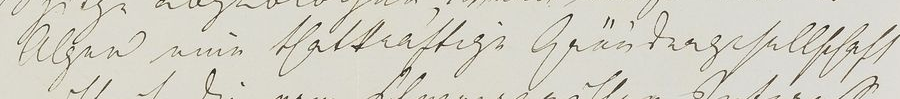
Alpen eine thatkräftige Gründergesellschaft
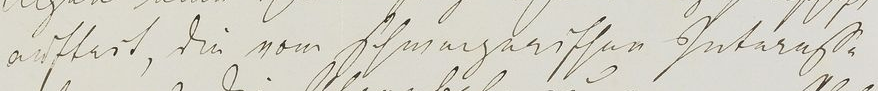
auftrit, die vom schweizerischen Interesse
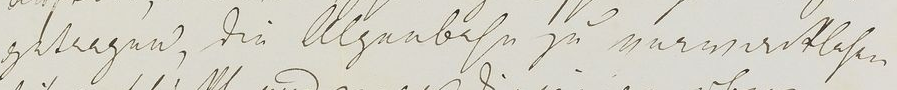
getragen, die Alpenbahn zu verwircklichen
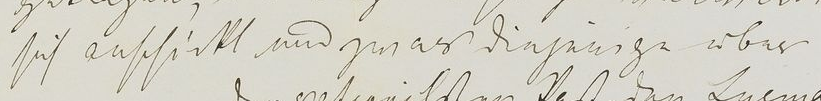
sich anschickt und zwar diejenige über
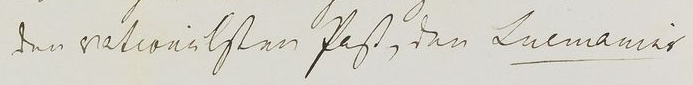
den rationelsten Paß, den Lucmanier.
